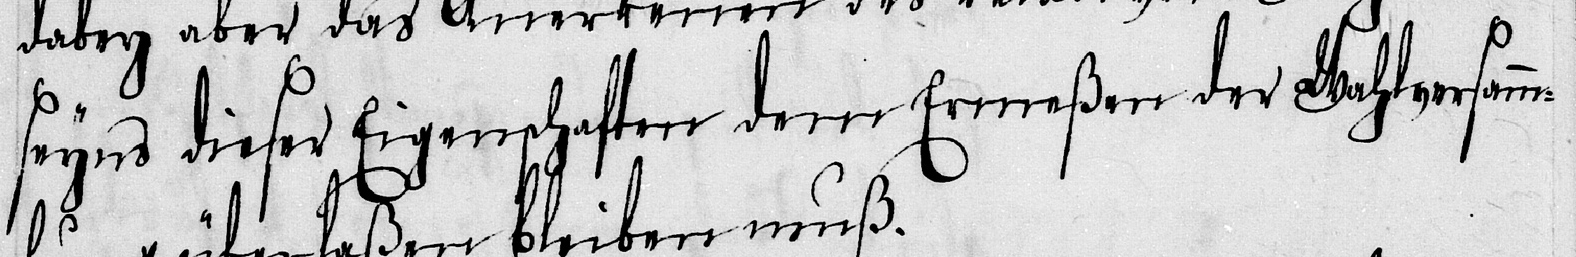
seyns dieser Eigenschaften dem Ermeßen der Wahlversam¬
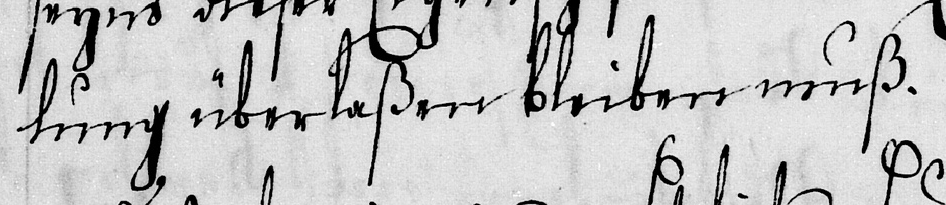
mlung überlaßen bleiben muß.
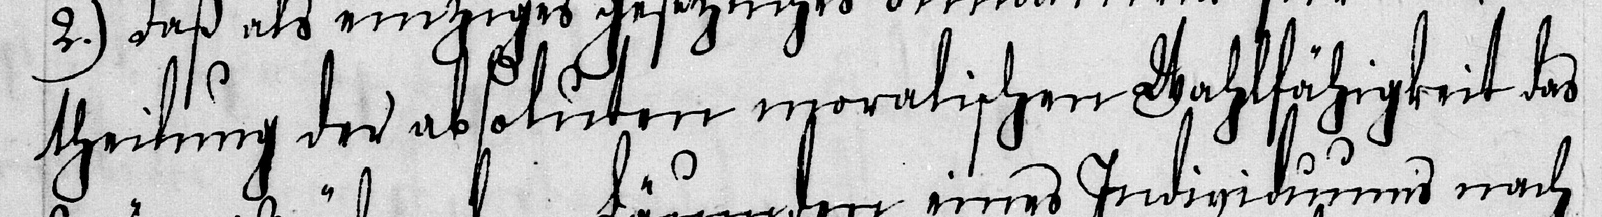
theilung der absoluten moralischen Wahlfähigkeit das
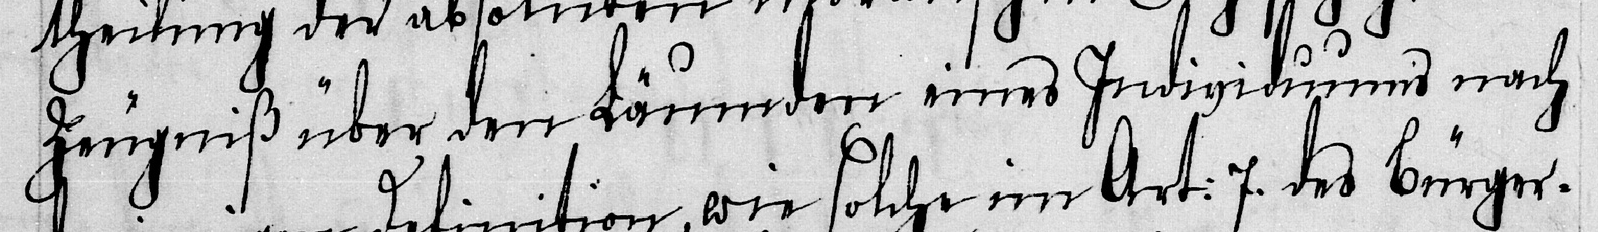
Zeugniß über den Läumden eines Individuums nach
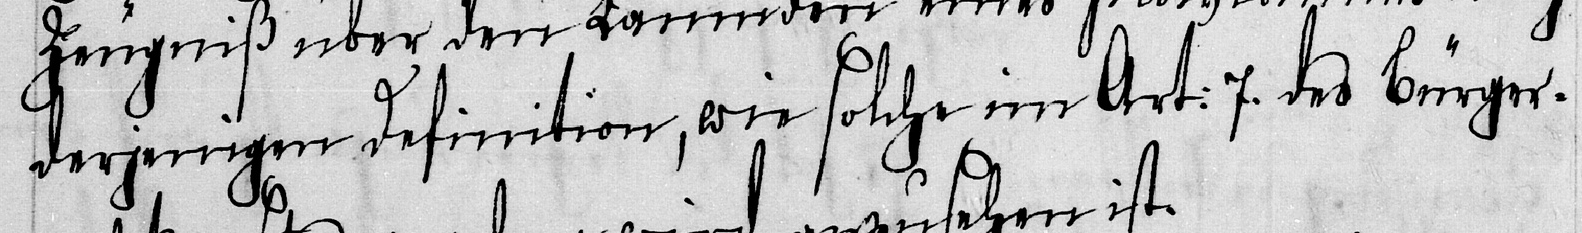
derjenigen Definition, wie solche im Art: 7. des Bürger¬
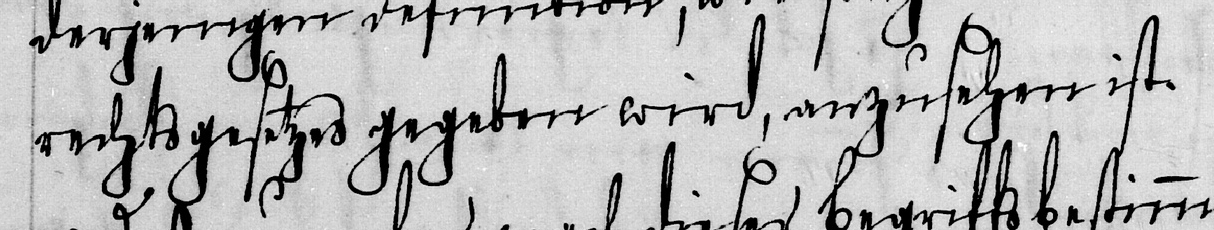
rechtsgesetzes gegeben wird, anzusehen ist.
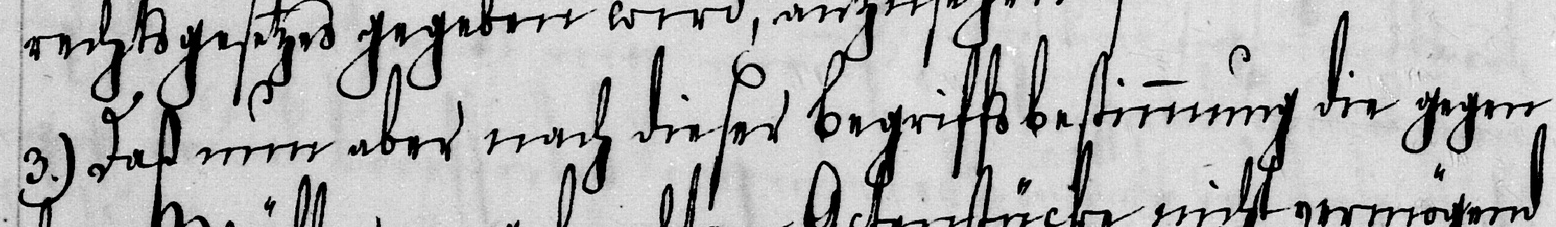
3.) Daß nun aber nach dieser Begriffsbestimmung die gegen
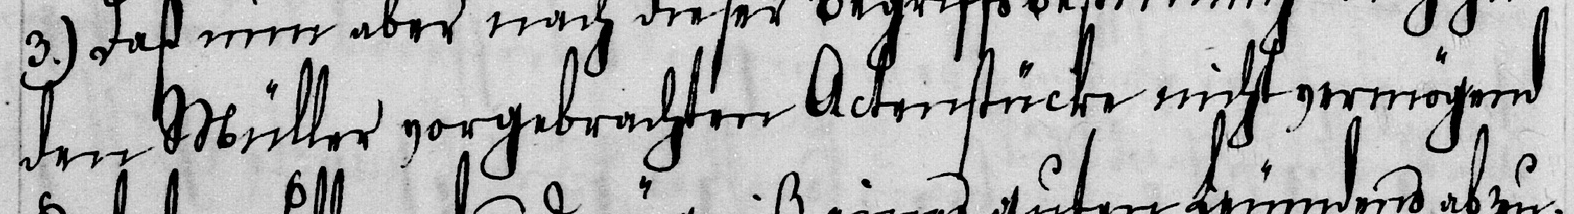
den Müller vorgebrachten Actenstücke nicht vermögend
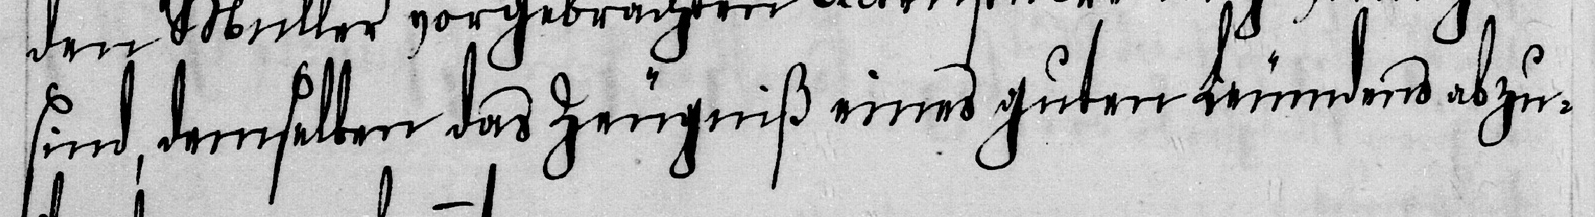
sind, demselben das Zeugniß eines guten Leumdens abzu¬
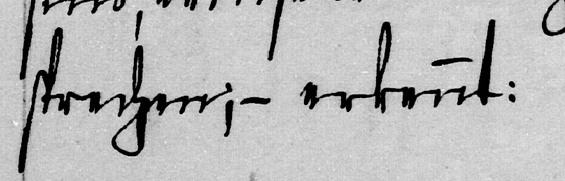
sprechen; – erkennt:
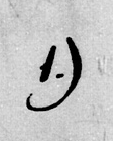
2.)
